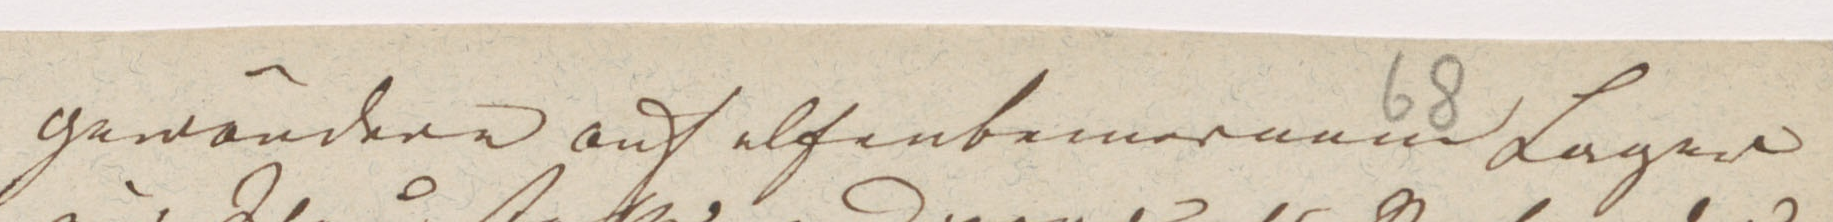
gewändern auf elfenbeinernem Lager
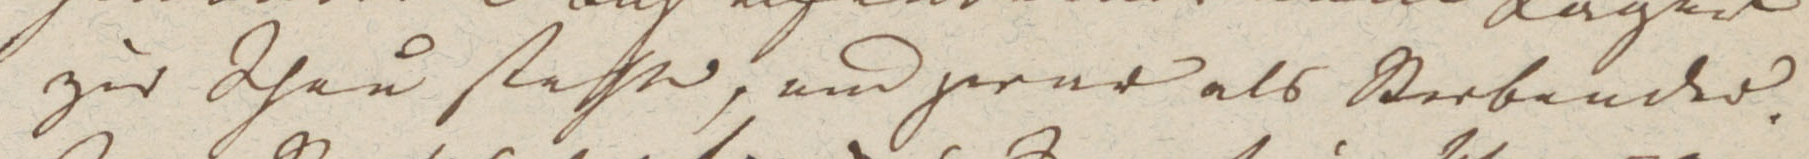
zur Schau steht, und zwar als Sterbender.
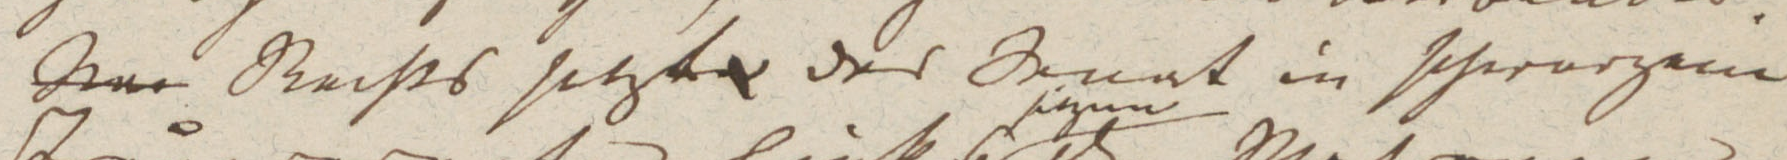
Na Rechts sitzte der Senat in schwarzem
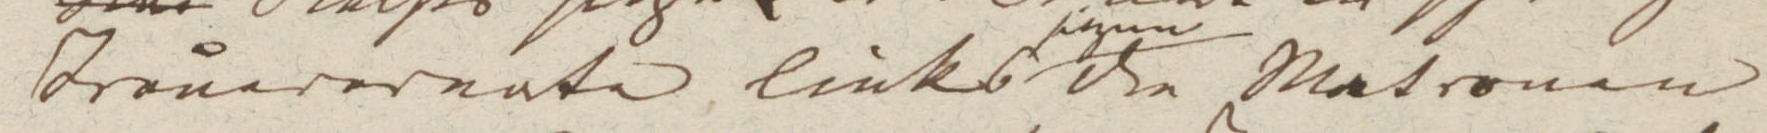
Trauerornate links sitzen die Matronen
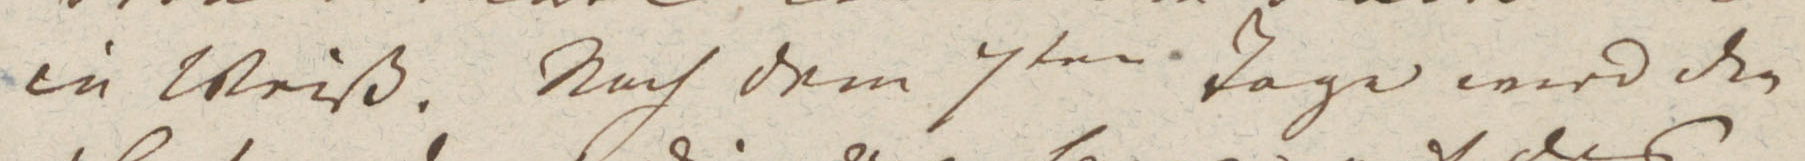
in Weiss. Nach dem 7ten Tage ward die
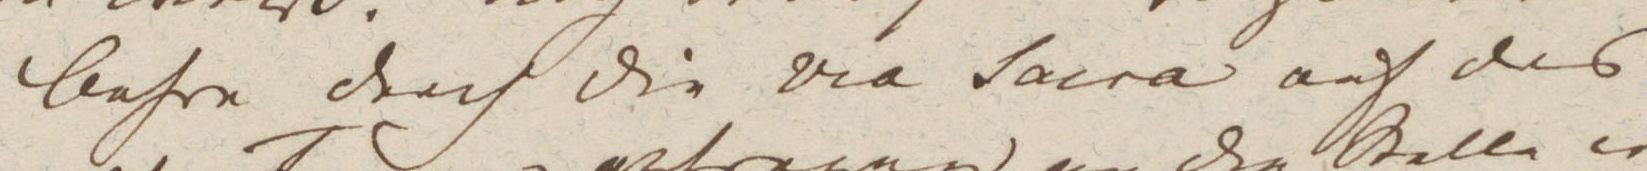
Bahre durch die via Sacra auf das
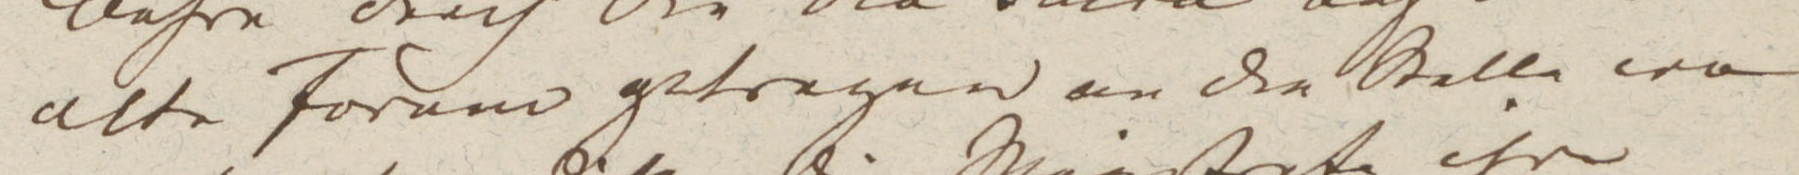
alte Forum getragen an die Stelle wo
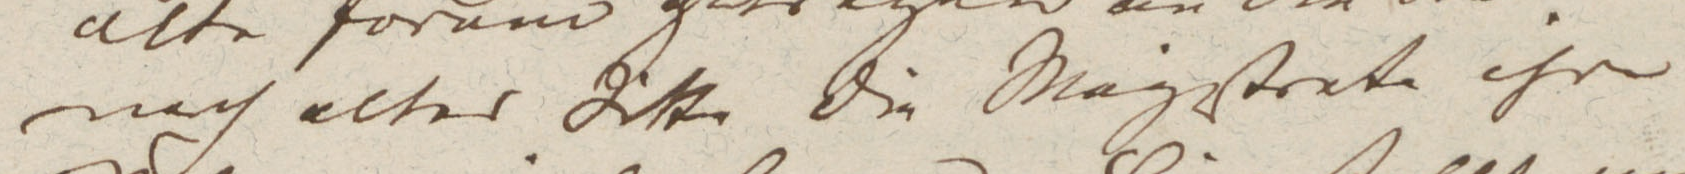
nach alter Sitte die Magistrate ihre
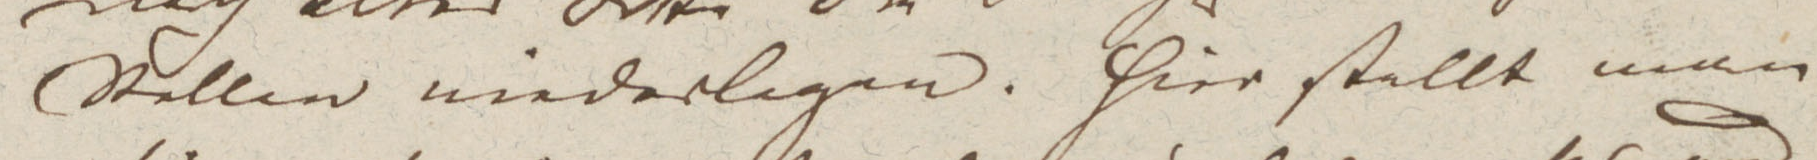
Stellen niederlegen. Hier stellt man
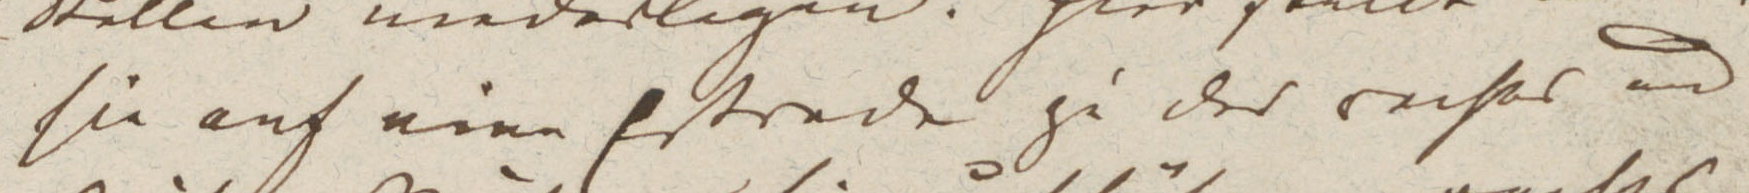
sie auf eine Estrade zu der rechts und
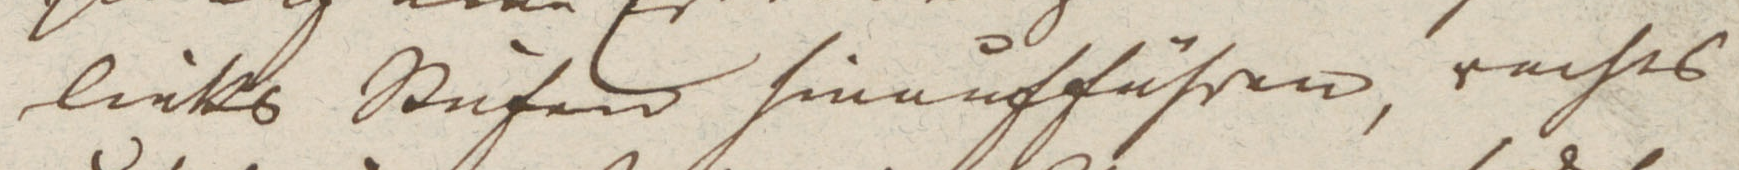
links Stufen hinaufführen, rechts
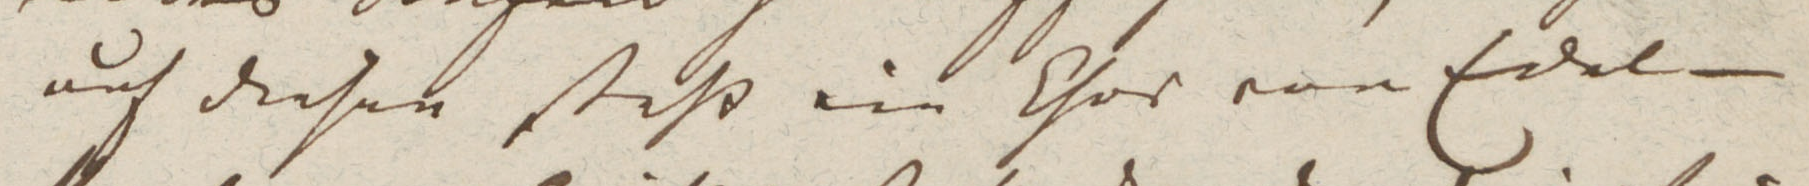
auf diesen stets ein Chor von Edel-
